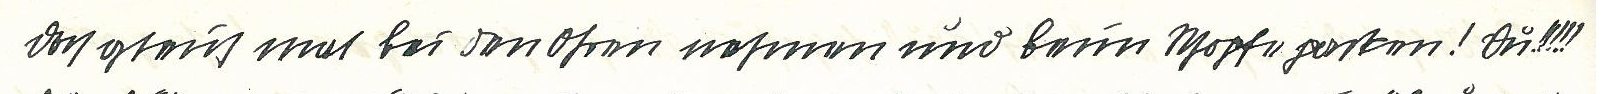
doch gleich mal bei den Ohren nehmen und beim Schopfe packen! Du!!!!!
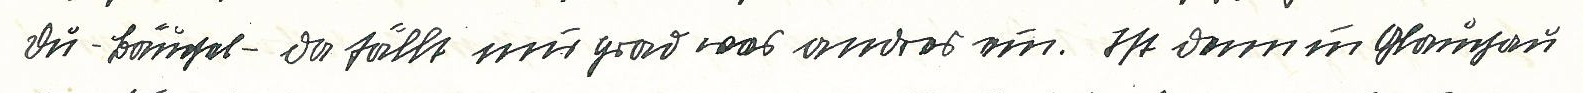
Du – Bäuchel – da fällt mir grad was andres ein. Ist denn in G.
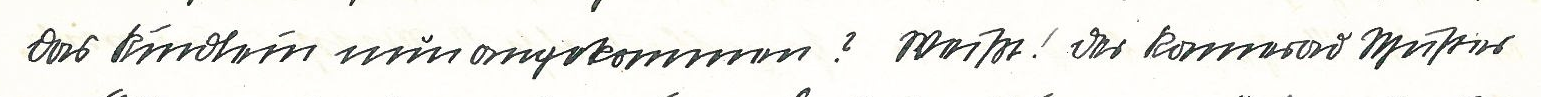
das Kindlein nun angekommen? Weißt! Der Kamerad Sch.
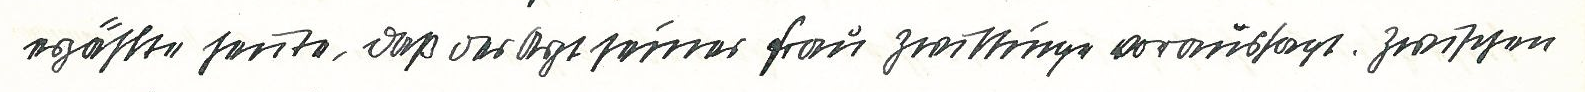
erzählte heute, daß der Arzt seiner Frau Zwillinge voraussagt. Zwischen
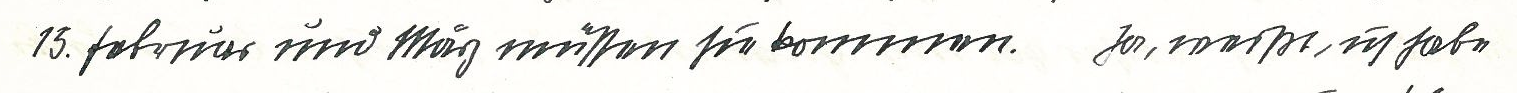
15. Februar und März müssen sie kommen. Ja weißt, ich habe
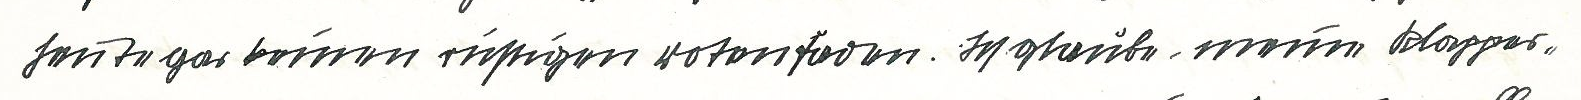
heute gar keinen richtigen roten Faden. Ich glaube, meine Klapper¬
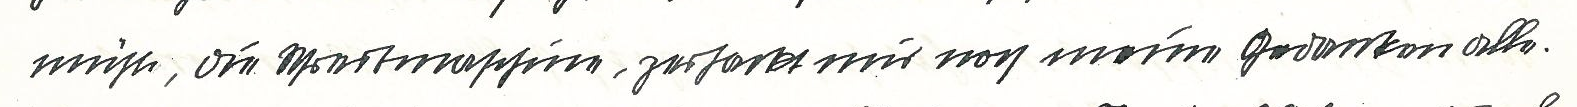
mühle, die Schreibmaschine, zerhackt mir noch meine Gedanken alle.
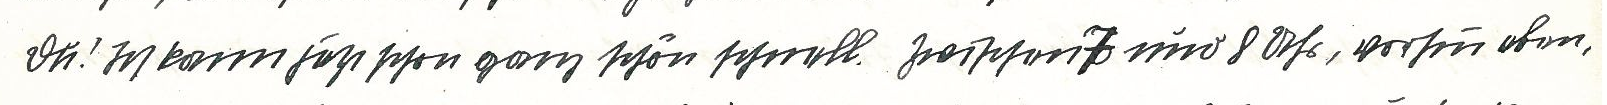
Du! Ich kann jetzt schon ganz schön schnell. Zwischen 7 und 8 Uhr, vorhin eben,
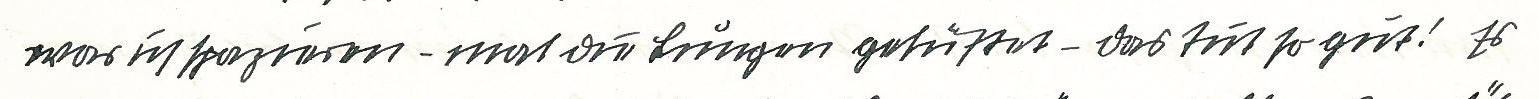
war ich spazieren – mal die Lungen gelüftet – das tut so gut! Es
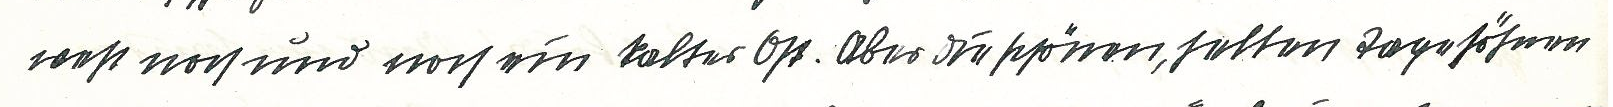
weht noch und noch ein kalter Ost. Aber die schönen hellen Tage söhnen
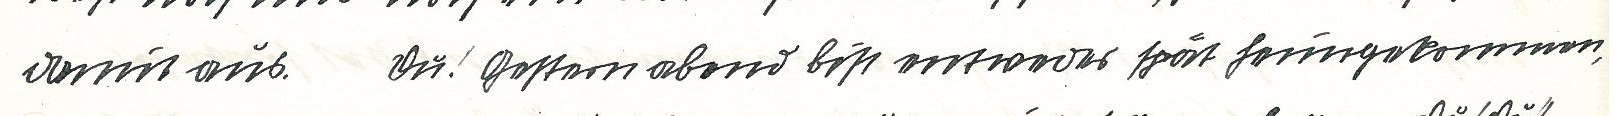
damit aus. Du, gestern abend bist entweder spät heimgekommen,
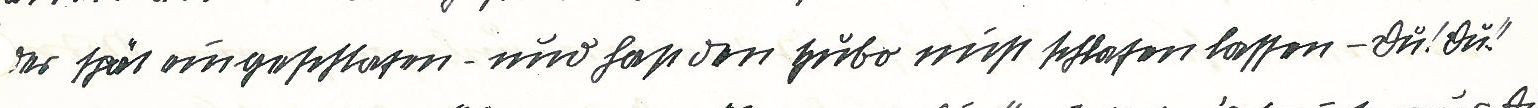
er spät eingeschlafen – und hast den Hubo nicht schlafen lassen – Du! Du!!
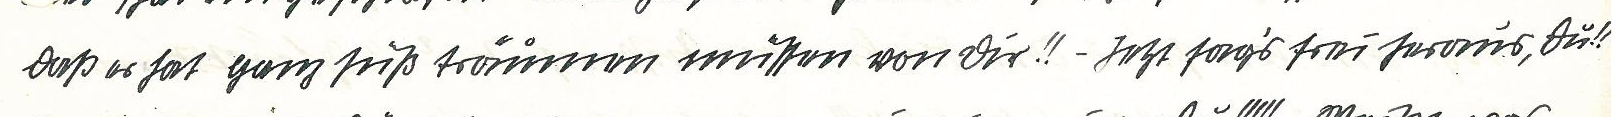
daß er hat ganz süß träumen müssen von Dir!! – Jetzt sags` frei heraus, Du!!
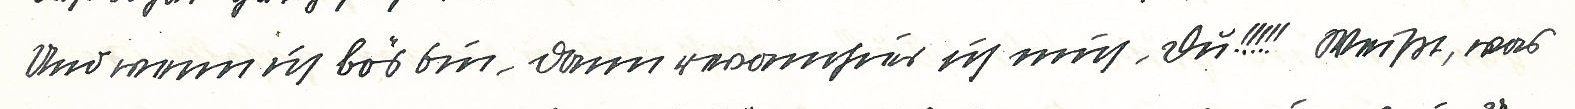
Und wenn ich bös bin, dann revanschier ich mich, Du!!!!! Weißt, was
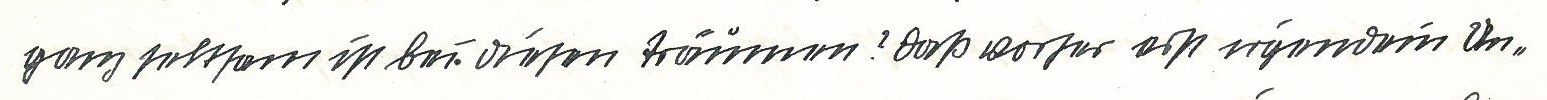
ganz seltsam ist bei diesen Träumen? Daß vorher erst irgendein Un¬
